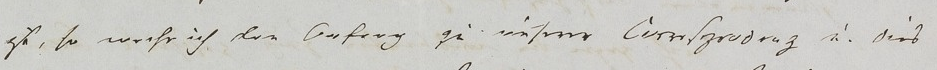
ist, so mache ich den Anfang zu unserer Correspondenz u. dies
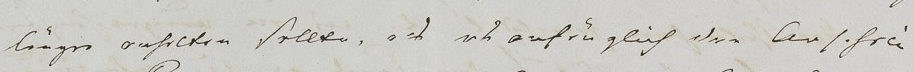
länger anhalten sollte, als es ursprünglich den Anschein
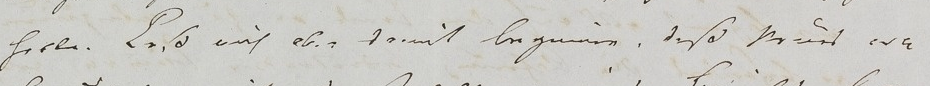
hatte. Laß mich aber damit beginnen, daß Neues von
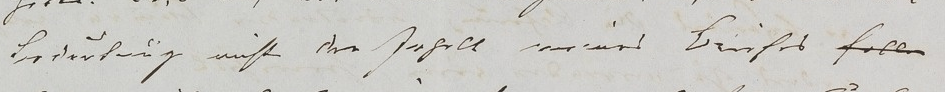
Bedeutung nicht den Inhalt meines Briefes falle
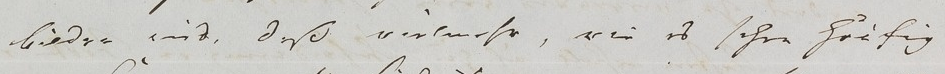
bilden wird, daß vielmehr, wie es schon häufig
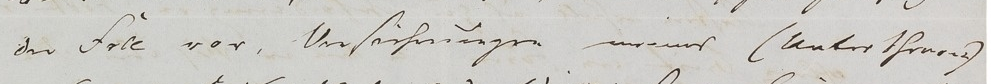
der Fall war, Versicherungen meiner (Unterthanen)
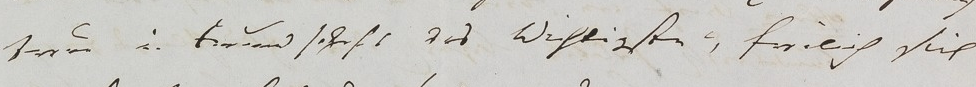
Treue u. Freundschaft das Wichtigste, freilich sich
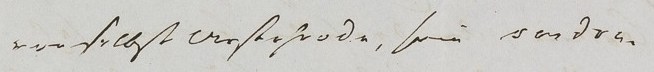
von selbst verstehenden, sein werden. –
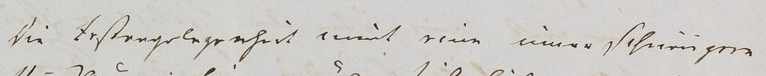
Die Festangelegenheit nimmt eine immer schwierigere
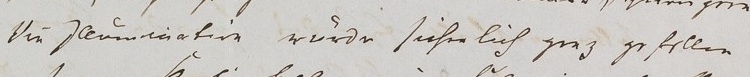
Die Illumination würde sicherlich ganz gefallen
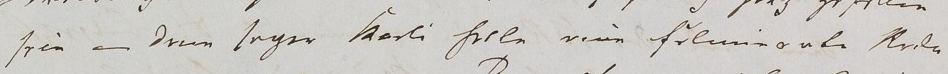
sein – denn sogar Karli hatte eine fulminante Rede
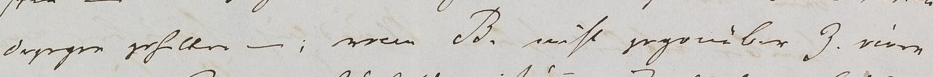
dagegen gehalten –, wenn B. nicht gegenüber Z. einen
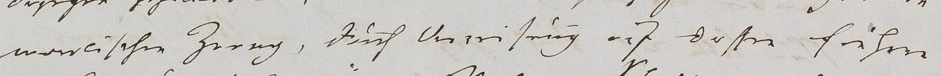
moralischen Zwang, durch Verweisung auf dessen frühere
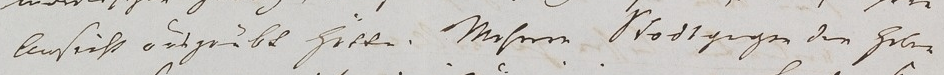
Ansicht ausgeübt hätte. Mehrere Stadtgegenden haben
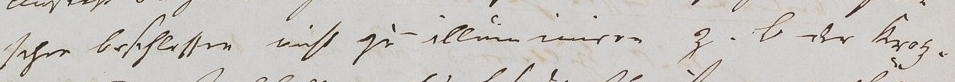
schon beschlossen nicht zu illuminiren z. B. der Kratz.
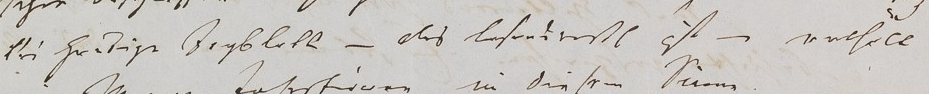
Das heutige Tagblatt – das lesenswerth ist – enthält
